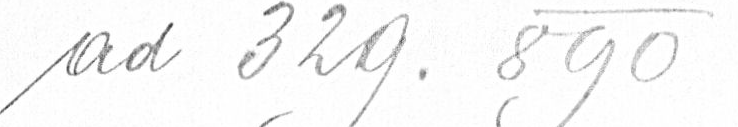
ad 329. 890
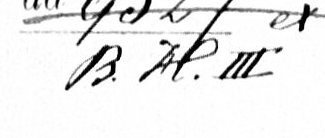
B.H.III
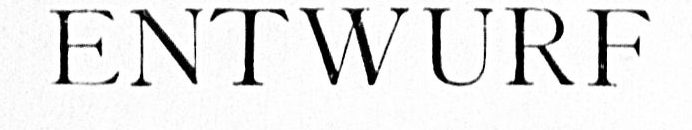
ENTWURF
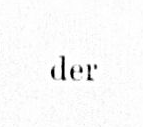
der
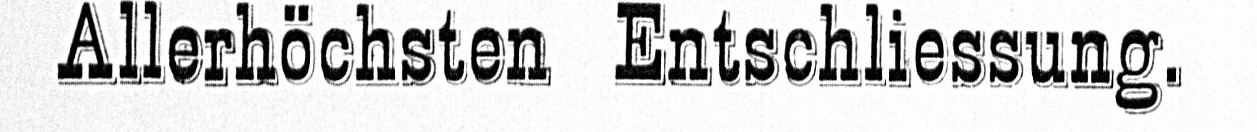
Allerhöchsten Entschliessung.
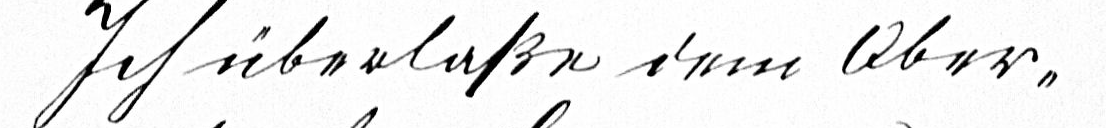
Ich überlaße dem Ober¬
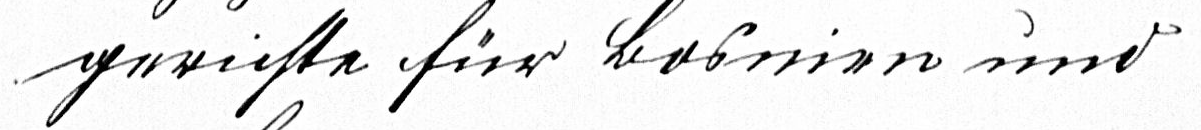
gerichte für Bosnien und
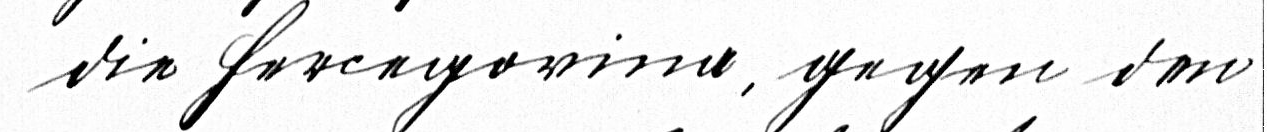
die Hercegovina, gegen den
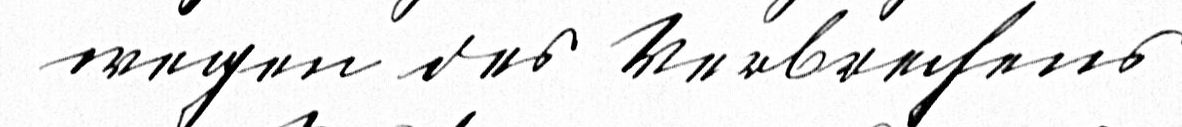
wegen des Verbrechens
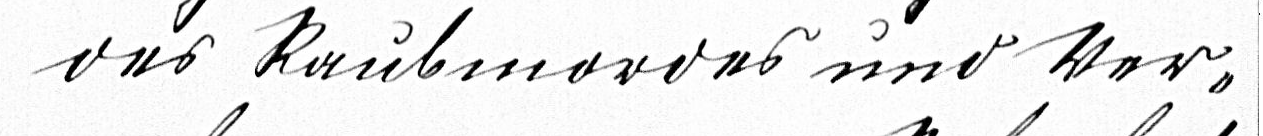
des Raubmordes und Ver¬
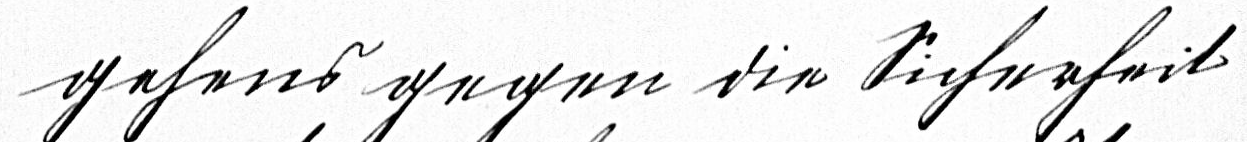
gehens gegen die Sicherheit
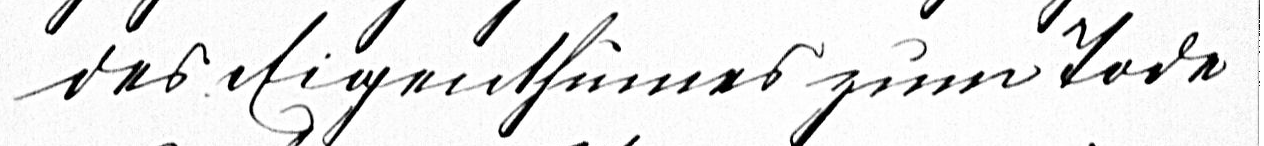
des Eigenthumes zum Tode
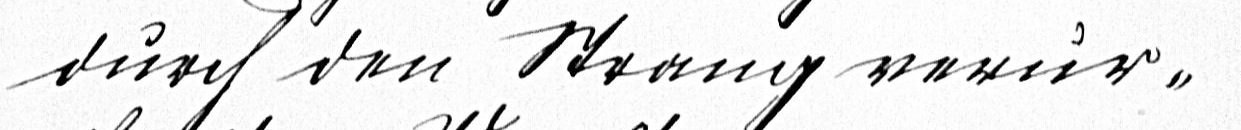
durch den Strang verur¬
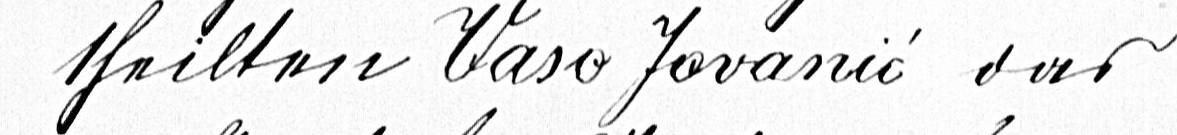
theilten Vaso Jovanić das
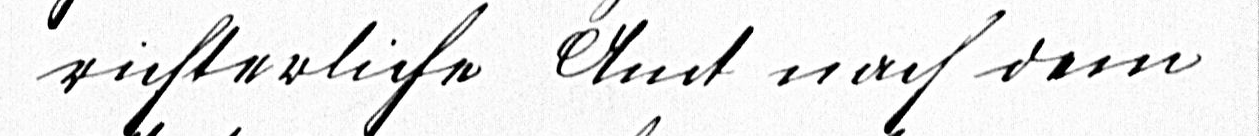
richterliche Amt nach dem
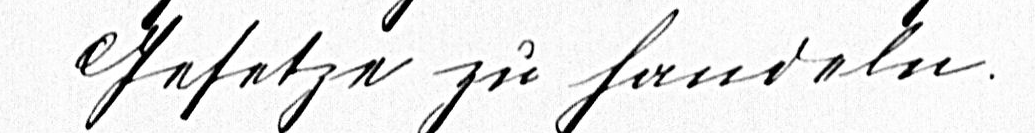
Gesetze zu handeln.
